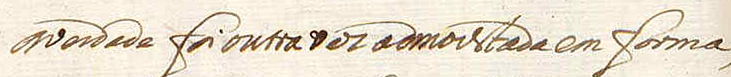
a verdade foi outra vez admoestada em forma,
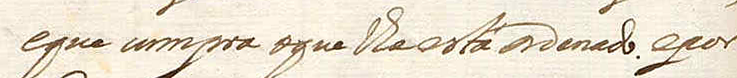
e que cumpra o que lhe está ordenado. e por
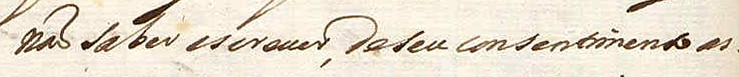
naõ Saber escrever, de seu consentimento as
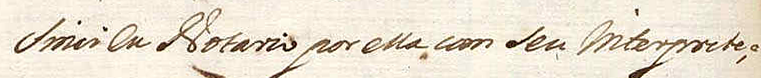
sinei Eu Notario por elle com seu Interprete, e
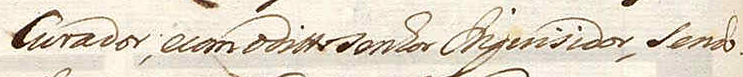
Curador, e com o ditto Senhor Inquisidor, Sendo
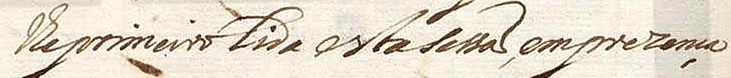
lhe primeiro lida esta sessaõ, em prezença
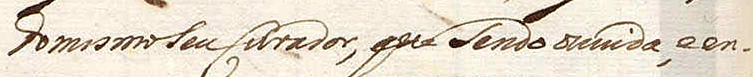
do mesmo seu Curador, que sendo ouuida, e em
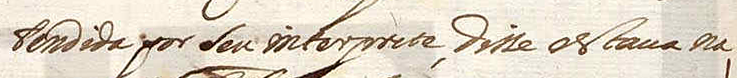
tendida por seu interprete, disse estaua na
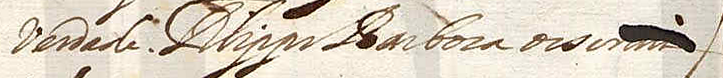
verdade. Filippe Barboza o escreui.
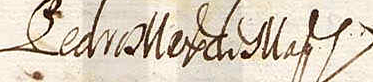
Pedro Mexia de Mag.es
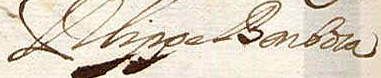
Filippe Barboza
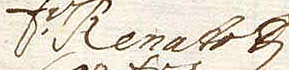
f.ey Renato V
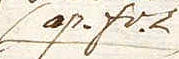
Cap. fr.z
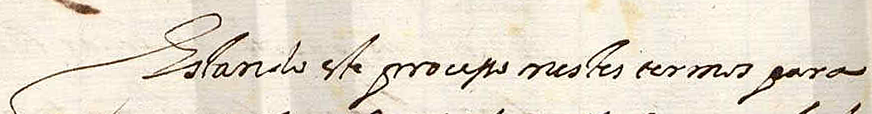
Estando este processo nestes termos para
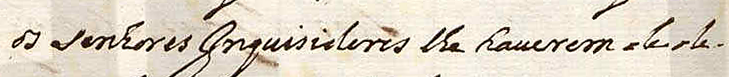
os senhores Jnquisidores lhe hauerem de de
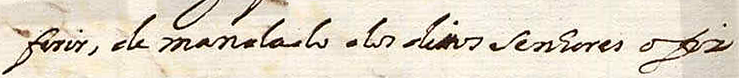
ferir, de mandado dos dittos senhores o fiz
